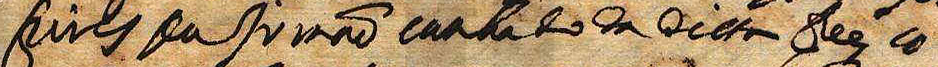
pires seu Jrmaõ cunhado da ditta Ree, co
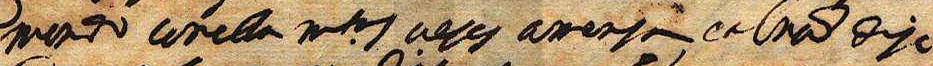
mendo con ella m.tas ueses a mensa, e al não dise
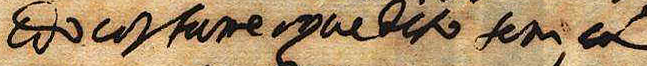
e do costume o que dito tem, ea
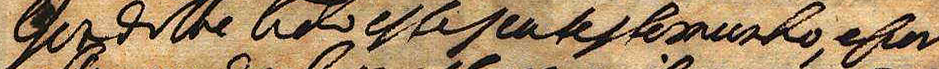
E sendolhe lido este seu testemunho, e por
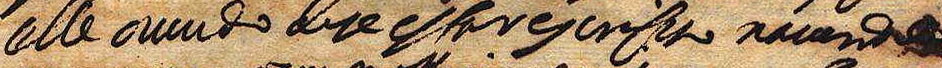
elle ouuido dise estar escripto na uerdade
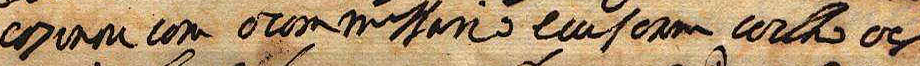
e asinou com o commissario e eu joam coelho o es
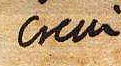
creui
